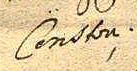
Constou;
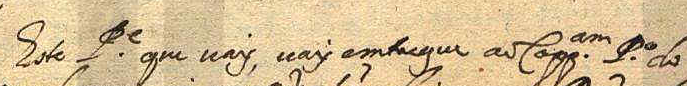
Este P.e que uay, uay emtregue ao Capp.am P.o do
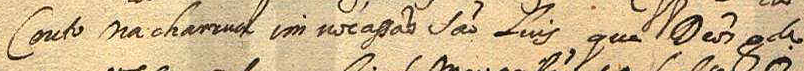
Couto na charrua imuocassão São Luis que Deos gde
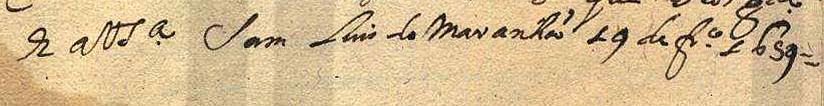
E a V S.a Sam Luis do Maranhaõ 19 de fr.o 1659
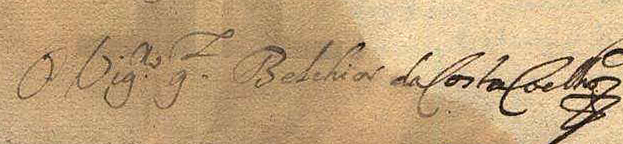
O Vigr.o g.L Belchior da Costa Coelho
